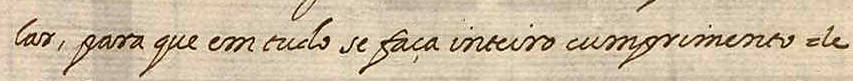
lar, para que em tudo se faça inteiro cumprimento de
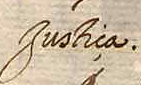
Justiça.
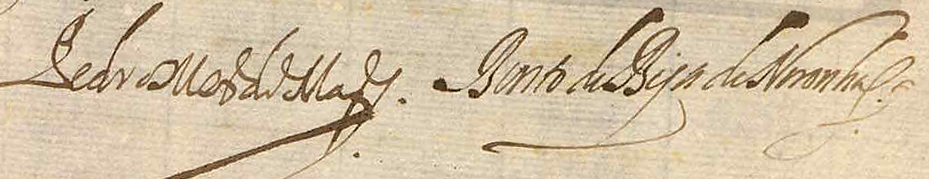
Pedro Mexa de Mages. Bento de Beja de Noronha
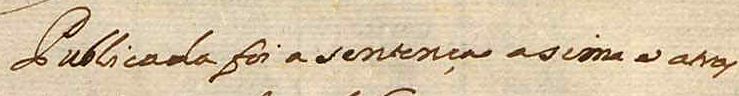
Publicada foi a sentença asima a atras
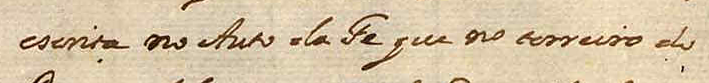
escrita no Auto da Fe que no terreiro do
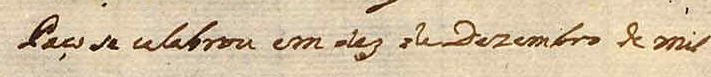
Paço se calabrou em dez de Dezembro de mil
